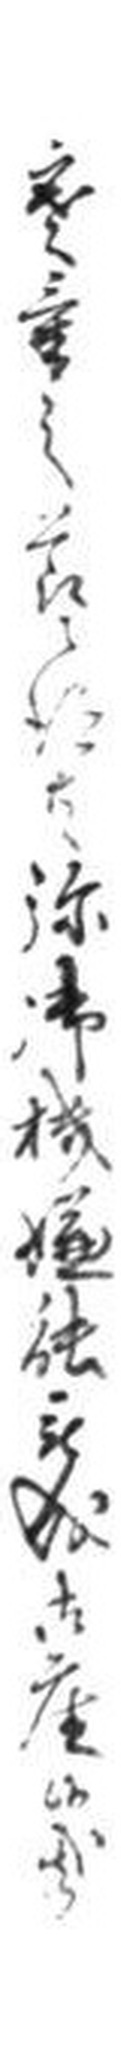寒気之節候得共弥御機嫌能被成御座候哉
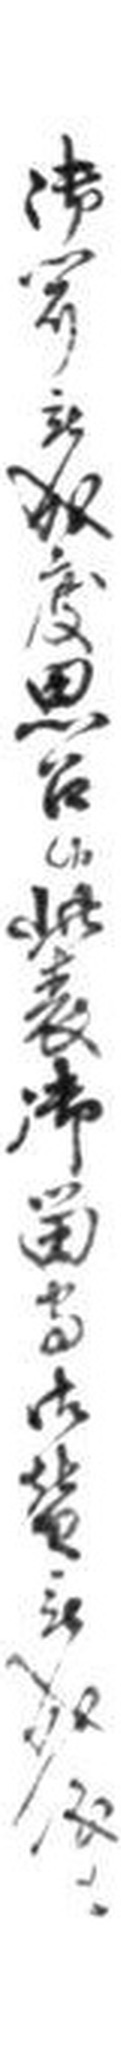御聞被成度思召候此表御留守御替被成儀も
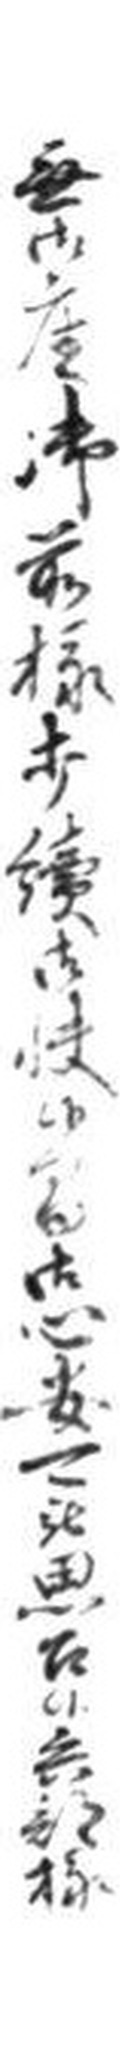無御座御前様相続御快候間御心安可被思召候兵部様
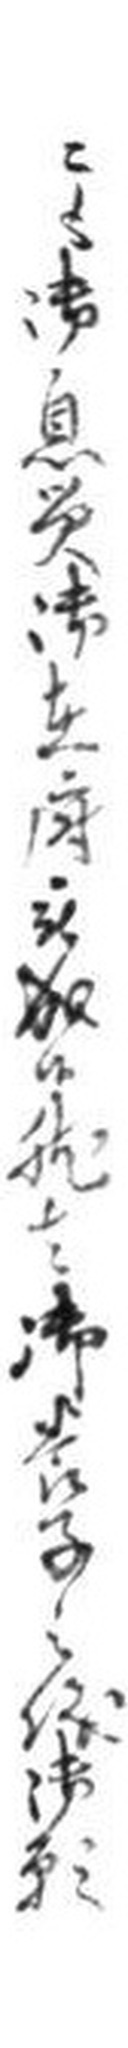ニも御息災御在府被成候然者御養子之儀御願
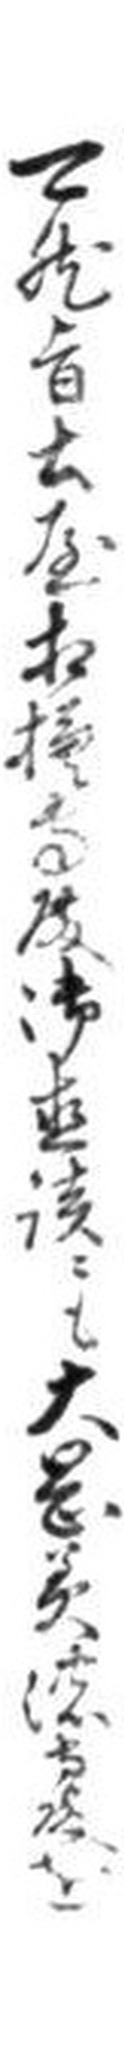可然旨土屋相模守殿御直談ニも大岡美濃守殿を
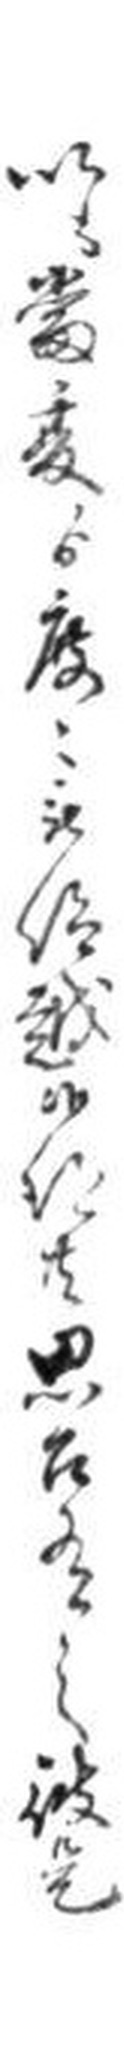以而当夏ゟ度々被仰越候得共思召有之彼是
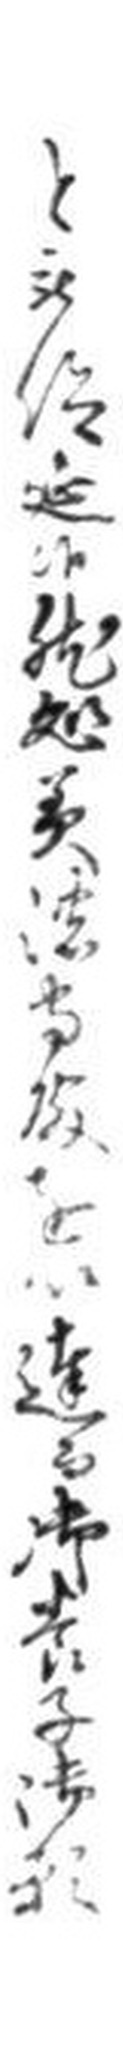と被仰延候然処美濃守殿を以達而御養子御願
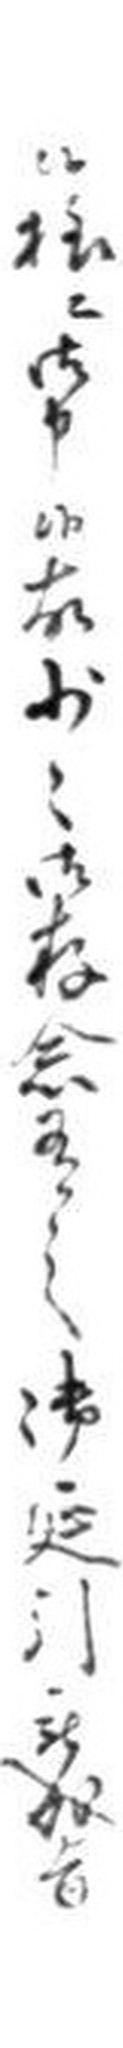候様ニ御申候故少々御存念有之御延引被成旨
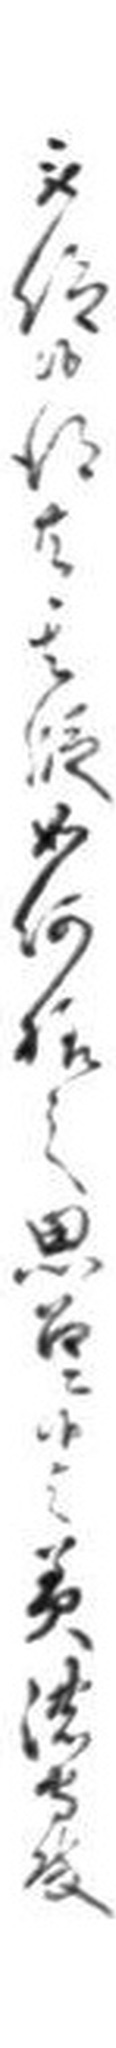被仰候得共其段如何様之思召ニ候与美濃守殿
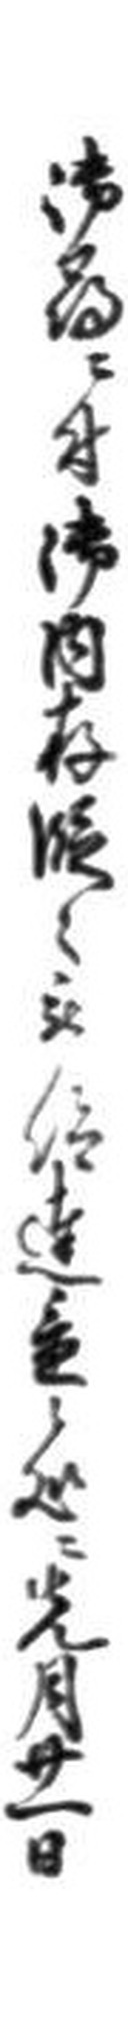御尋ニ付御内存段々被仰達置候処ニ先月廿一日
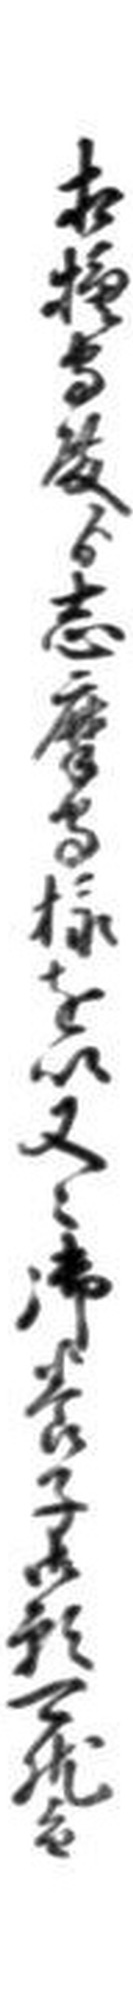相模守殿ゟ志摩守様を以又々御養子御願可然旨
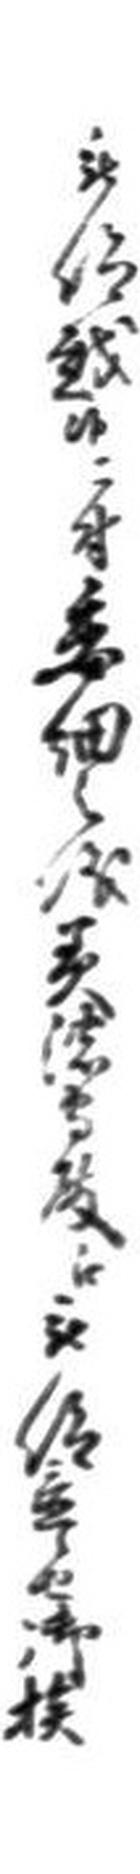被仰越候ニ付委細之儀美濃守殿江被仰置候由御挨
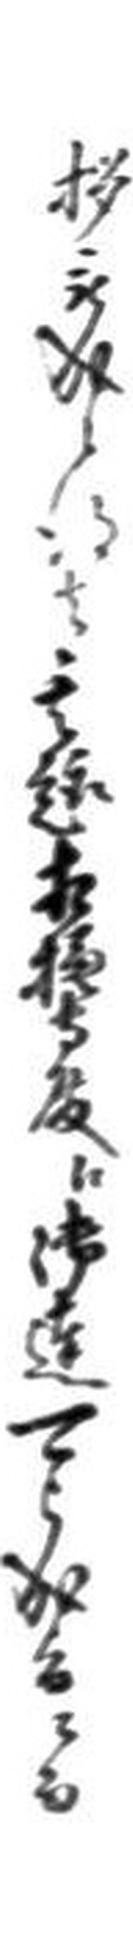拶被成候得者其趣相模守殿江御達可被成旨ニ而
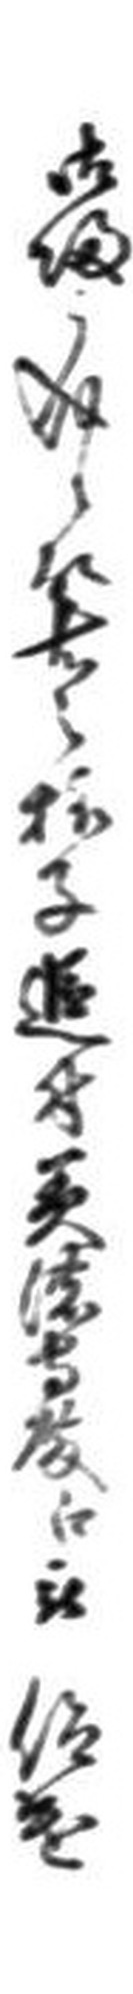御帰被成候故右之様子追付美濃守殿江被仰遣
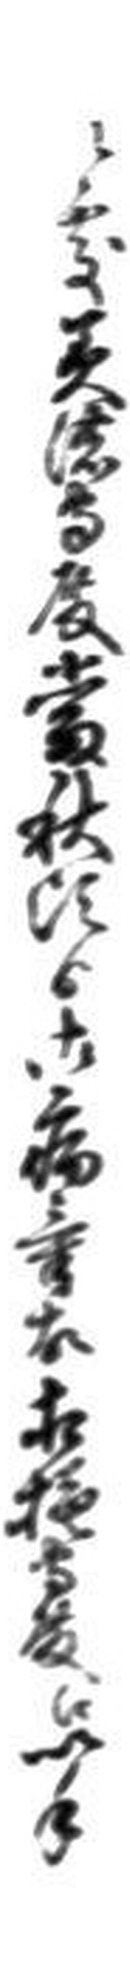候処美濃守殿当秋頃ゟ御病気故相模守殿江以手
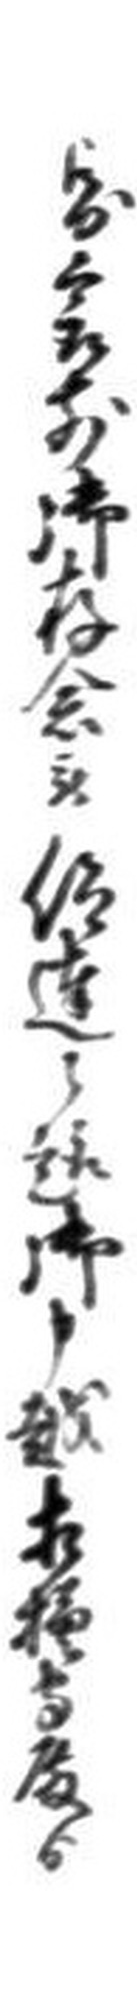紙最前御存念被仰達候趣御申越相模守殿ゟ
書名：家譜 二十一 吉品公 従元禄十三年到同十四年
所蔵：福井県文書館 Fukui Prefectural Archives
